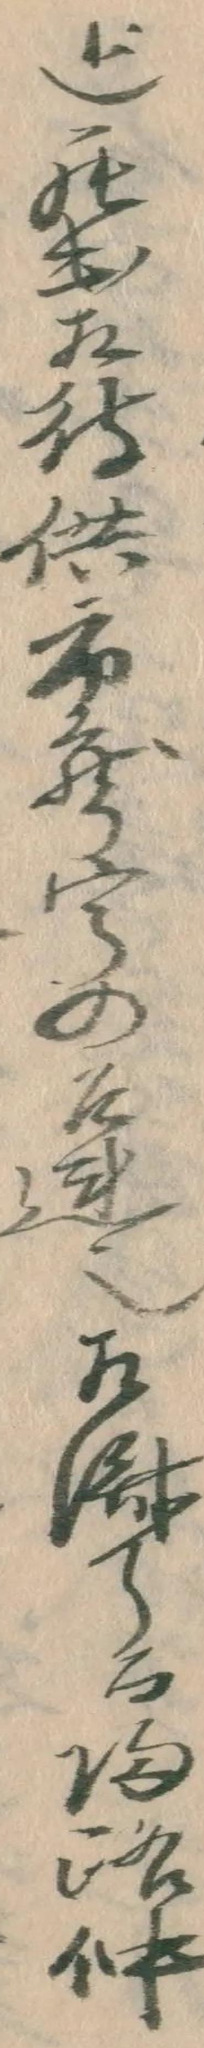迄罷出相待供市蔵うの召連也相済了而帰路仲
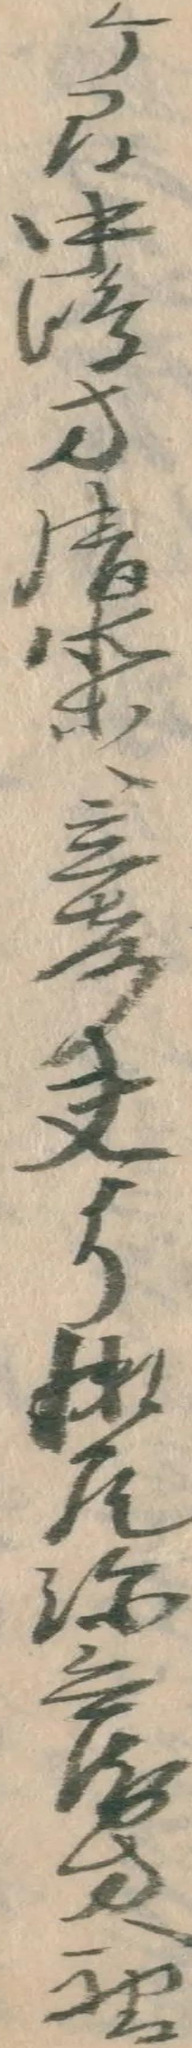ヶ間中嶋方清水等へ立寄夫より瀬尾弥兵衛方へ初而
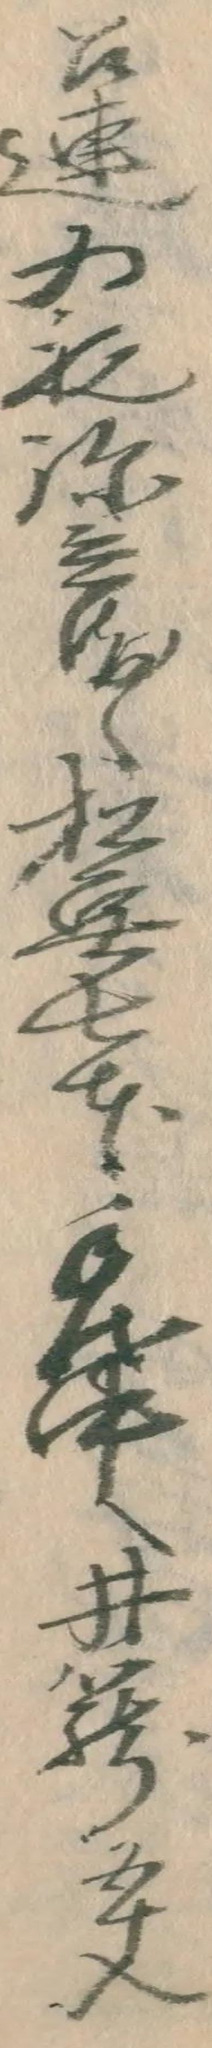召連為祝弥兵衛へ松魚七本手代中へ井籠五丈
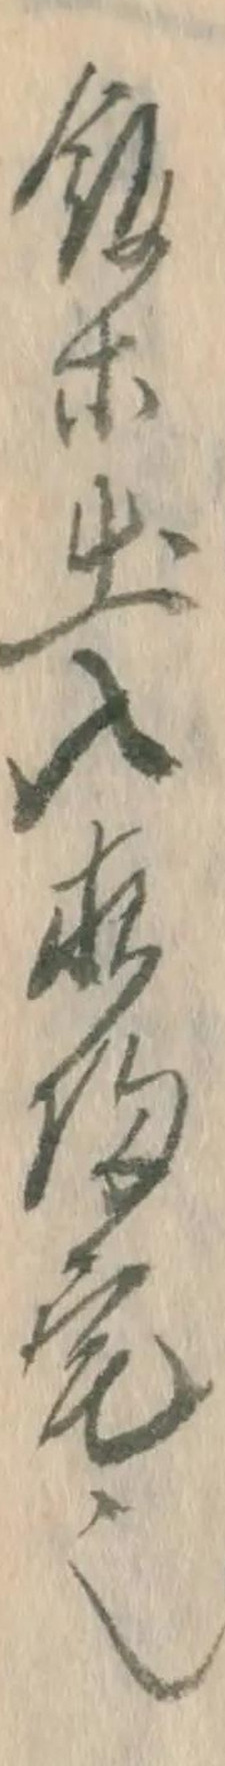飯等出入夜帰宅也

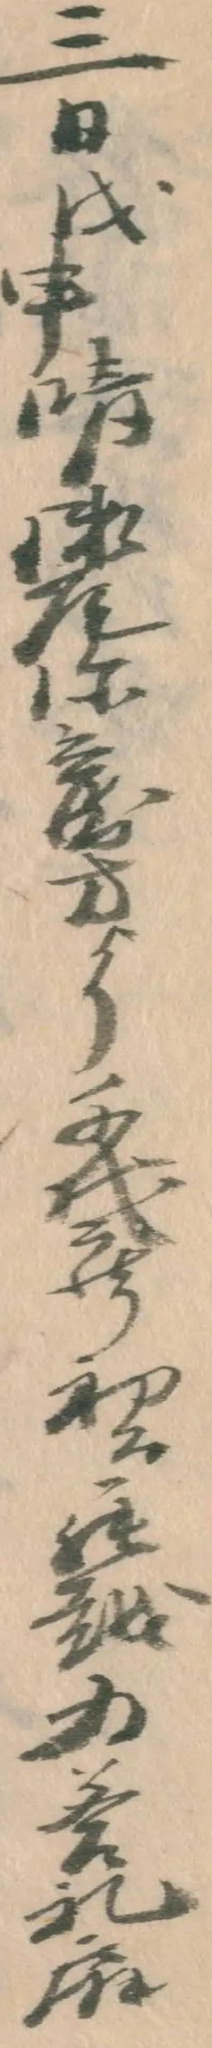三日戊申晴瀬尾弥兵衛方より千代蔵初而罷越為答礼扇
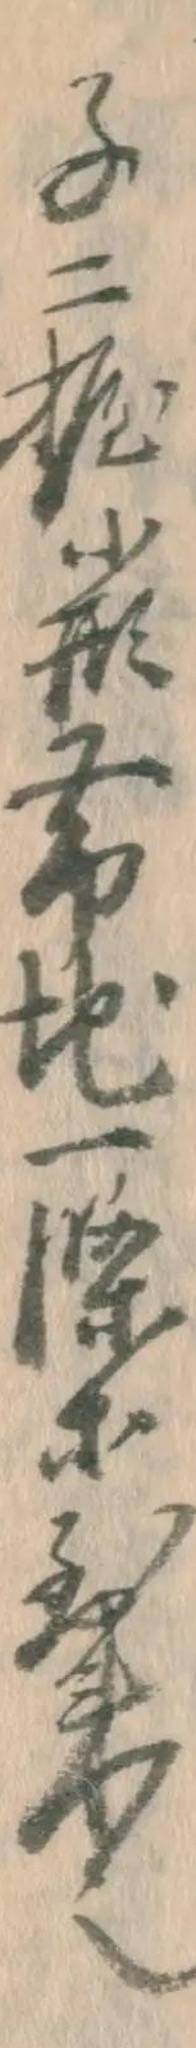子二握小形帯地一條等到来也
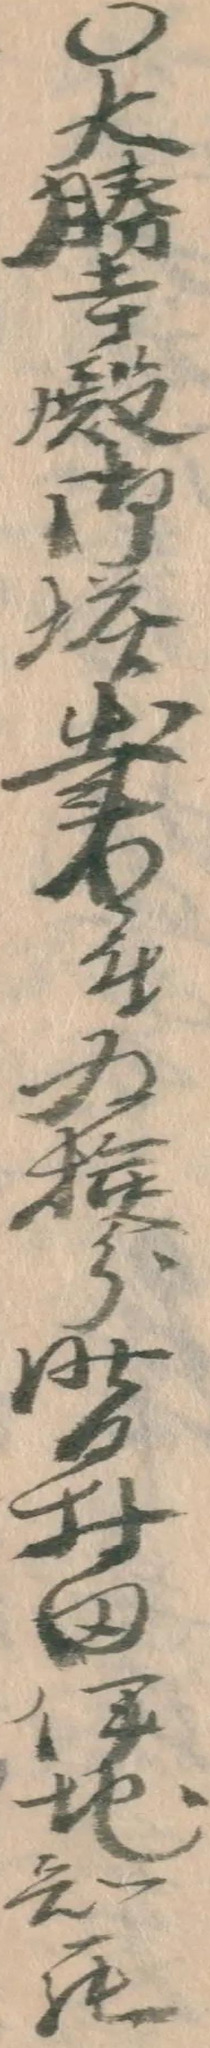○大勝寺殿御塔出来ニ付為検分昨日村田伊地知罷
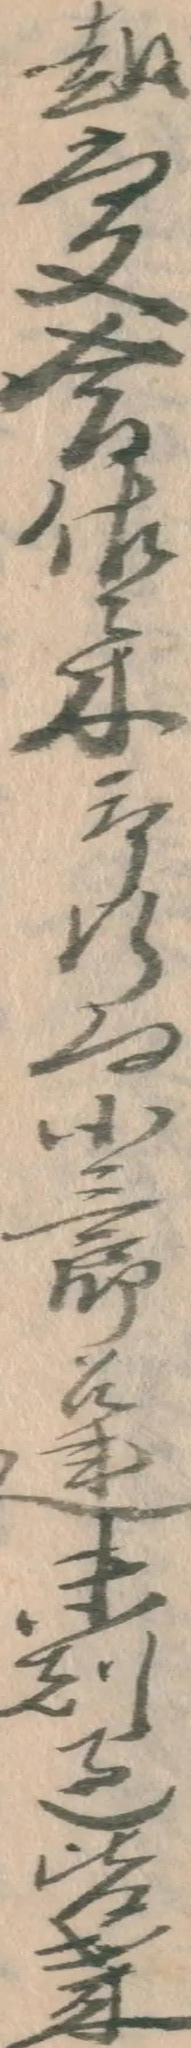越尚又今日佐々木予行向小三郎召連未刻過皆出来
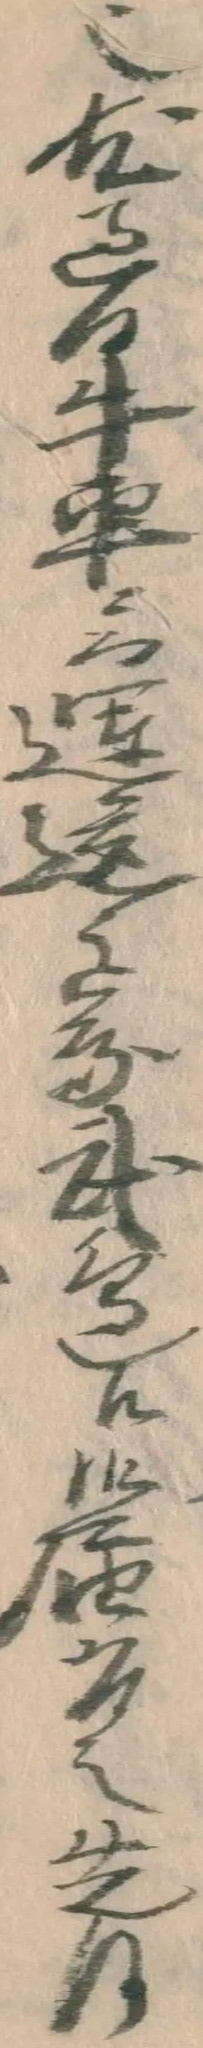也尤過日牛車ニ而運送之義武邊え御届有之先月
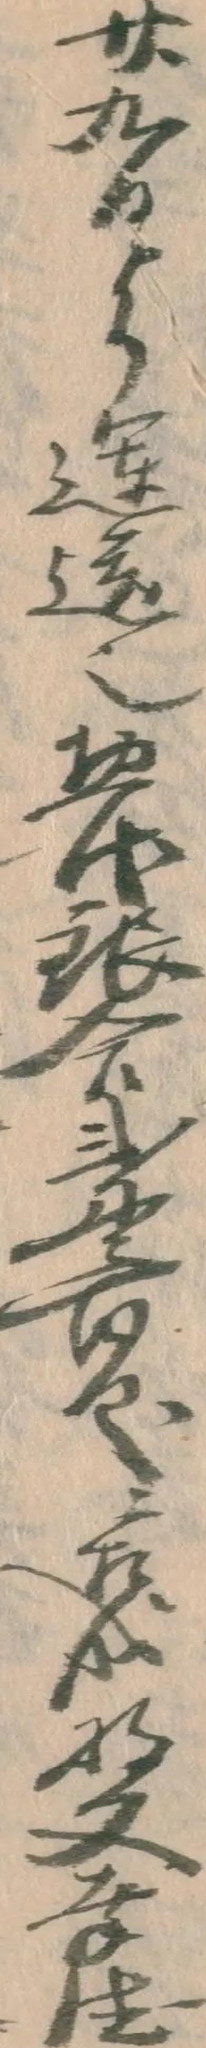廿九日より運送也惣代銀合弐貫百匁ニ相成将又幸徳
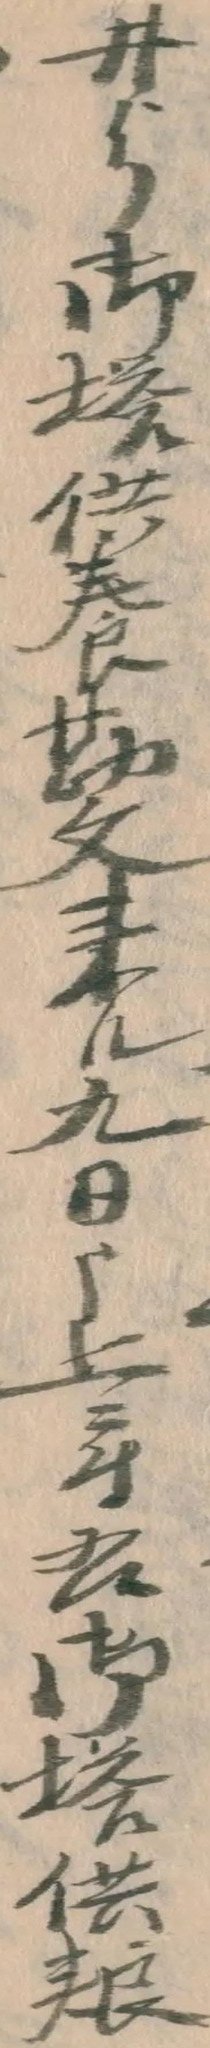井より御塔供養勘文来ル九日申上ニ付右御塔供養
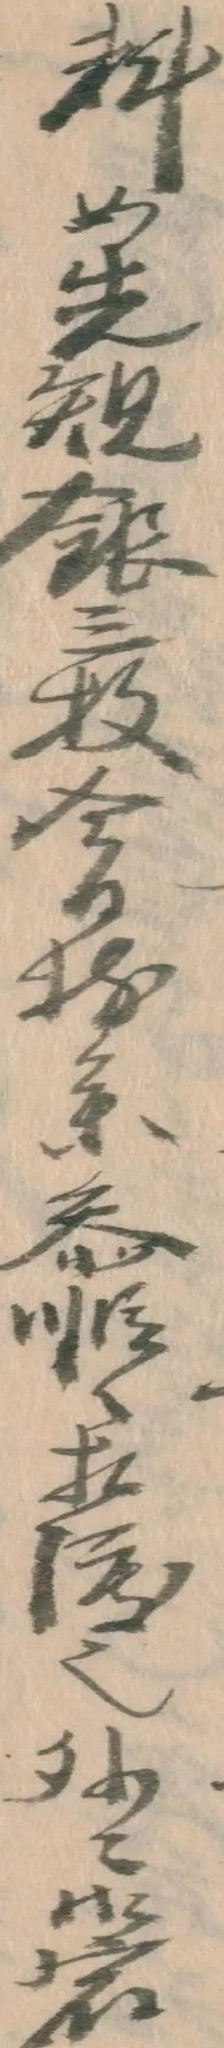料如先規銀三枚今日持参恭順へ相渡也外ニ御宿
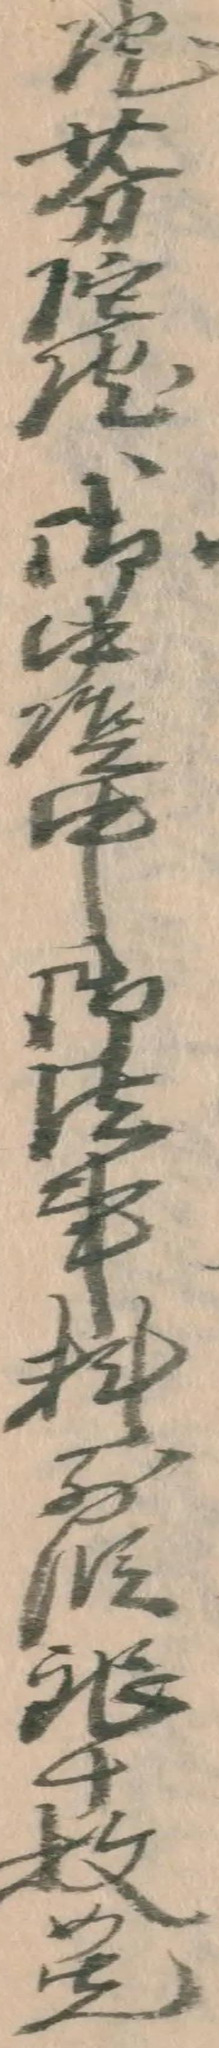院芬陀院へ御中陰中御法事料別段銀十枚御先
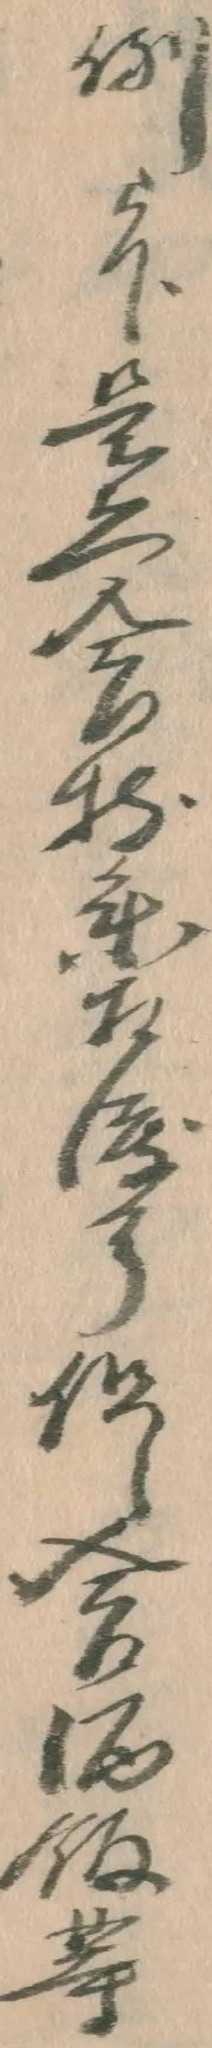例被下是亦今日持参相渡了但し今日酒飯等
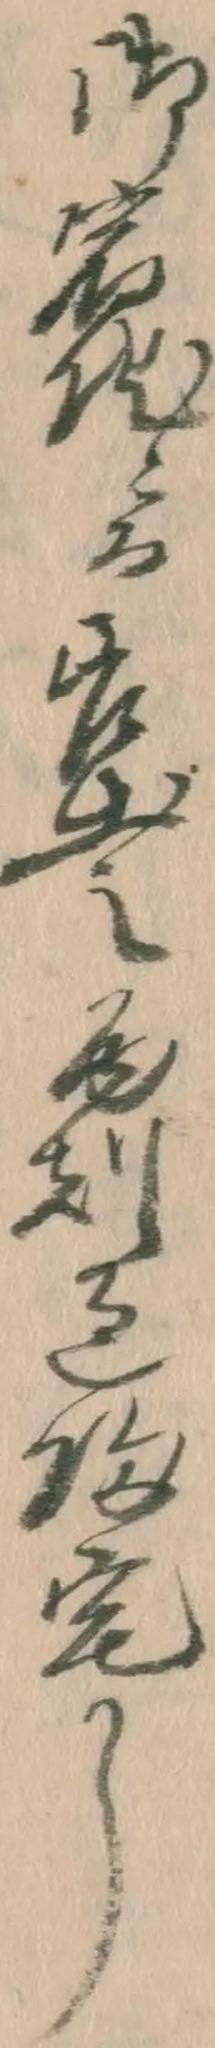御宿院ニ而差出也酉刻過帰宅了
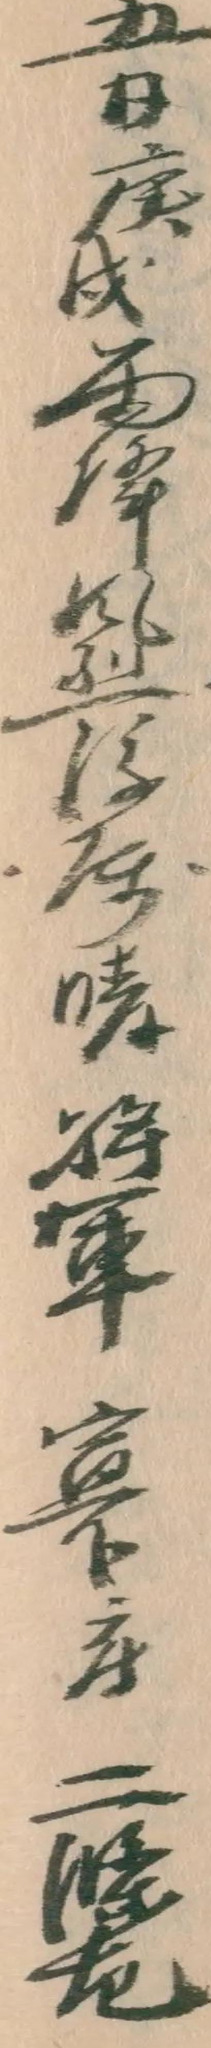五日庚戌雨降風烈後属晴将軍宣下ニ付二條左
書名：賀茂社記録. 第67冊
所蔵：国立国会図書館 National Diet Library, JAPAN
